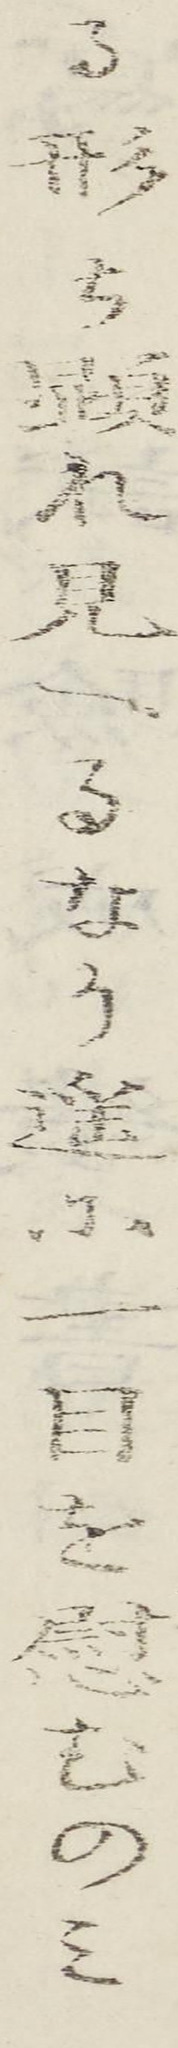る形ち顕れ見へるなり遥に一目を慰むのみ

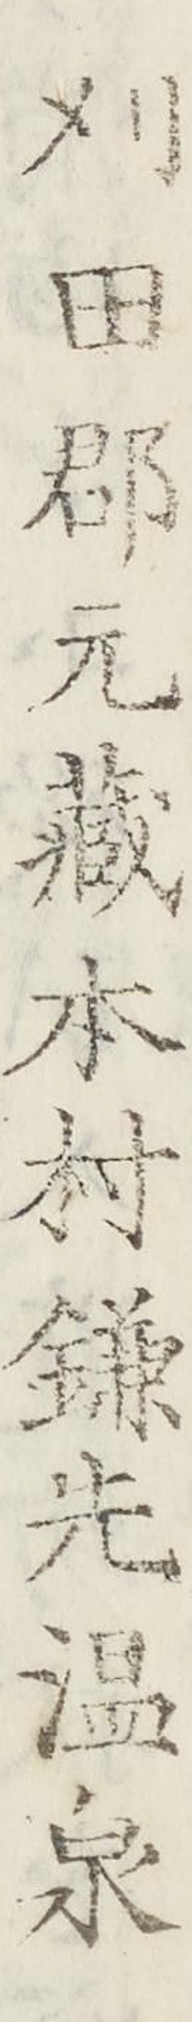刈田郡元蔵本村鎌先温泉
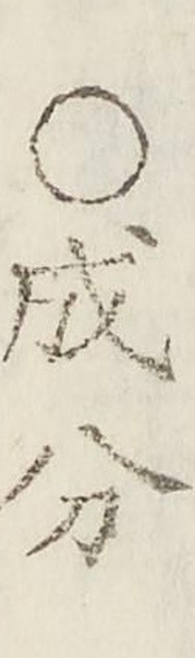〇成分
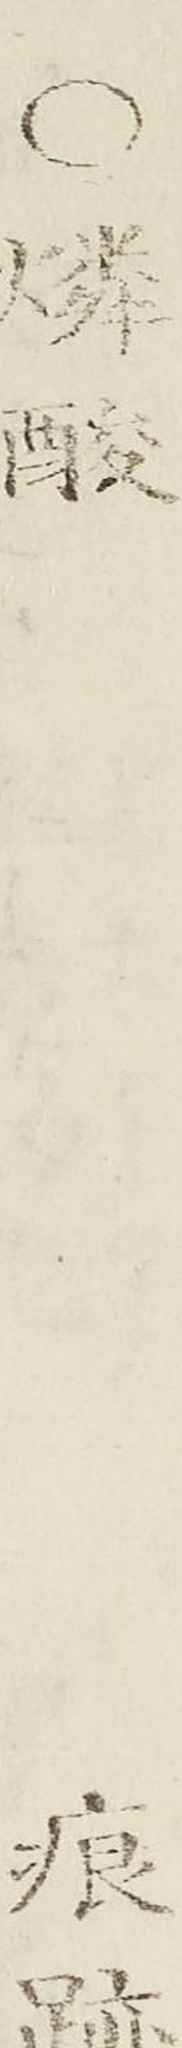〇燐酸痕跡
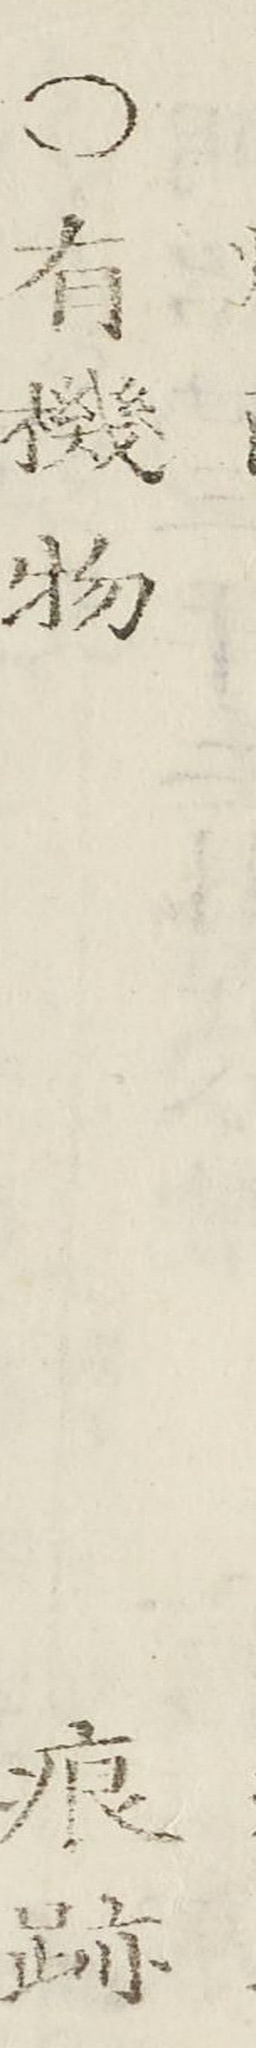〇有機物痕跡
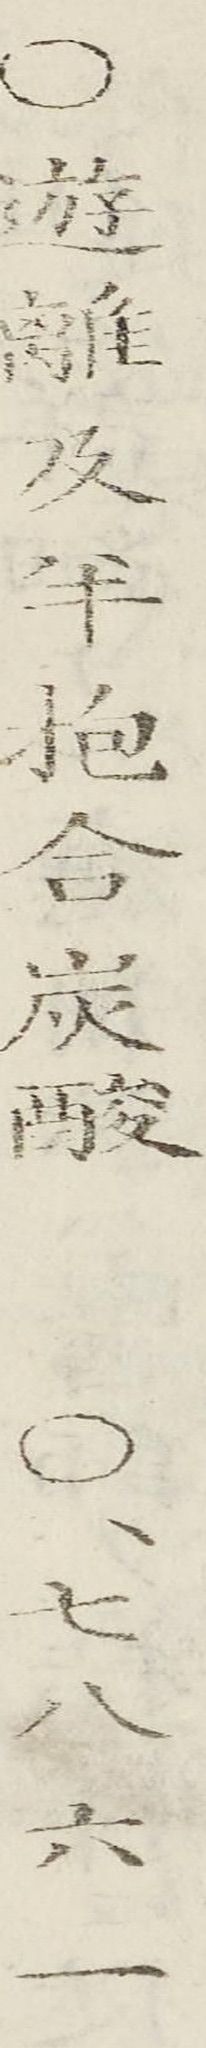〇遊離及半抱合炭酸〇、七八六一
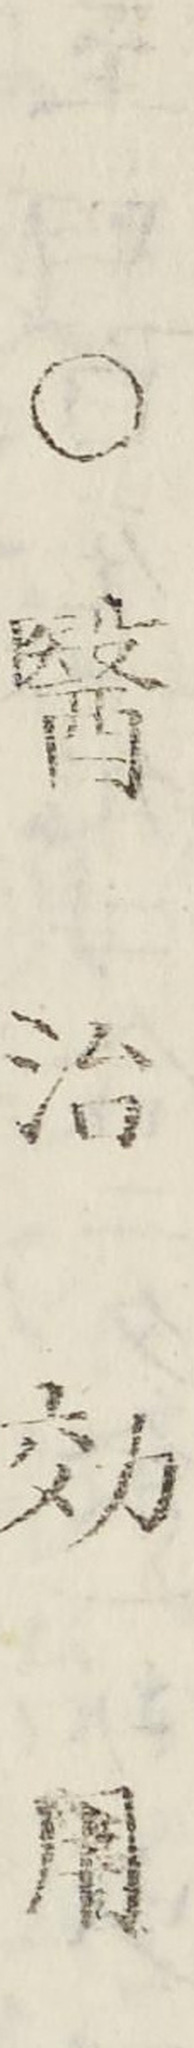〇医治効用
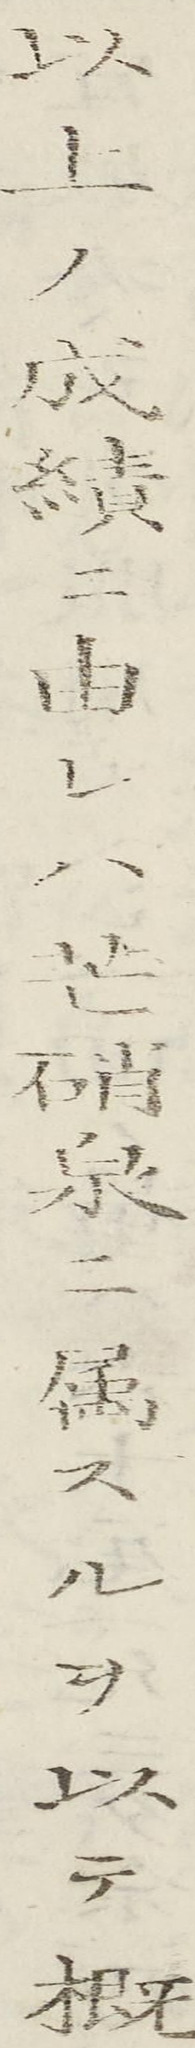以上ノ成績ニ由レハ芒硝泉ニ属スルヲ以テ概
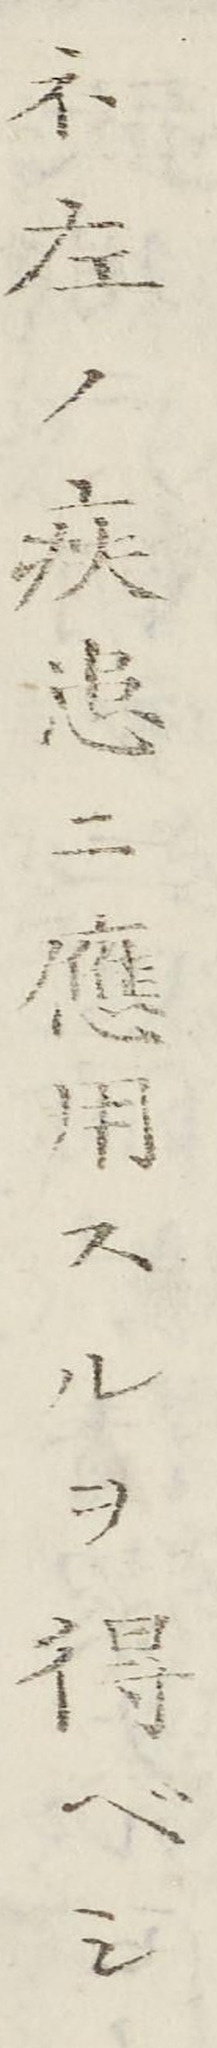ネ左ノ疾患ニ応用スルヲ得ベシ
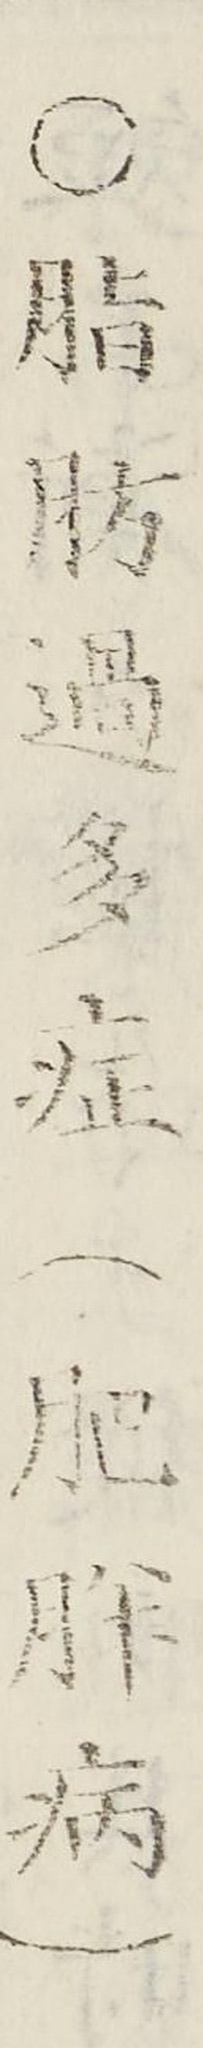〇脂肪過多症
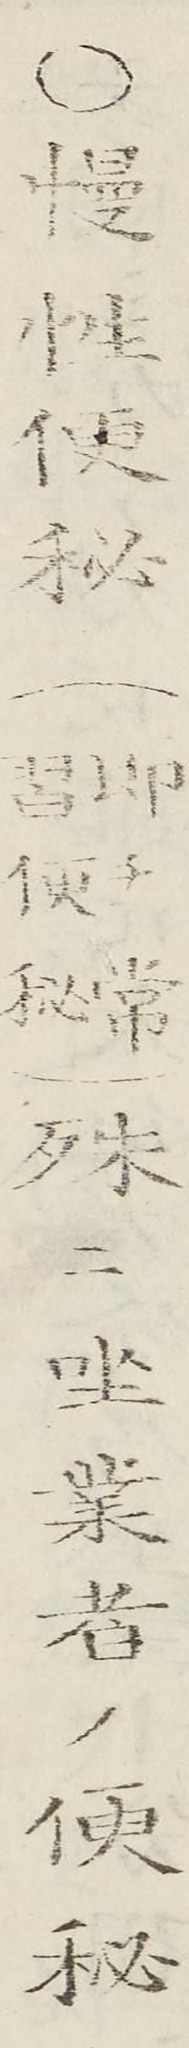〇慢性便秘殊二坐業者ノ便秘
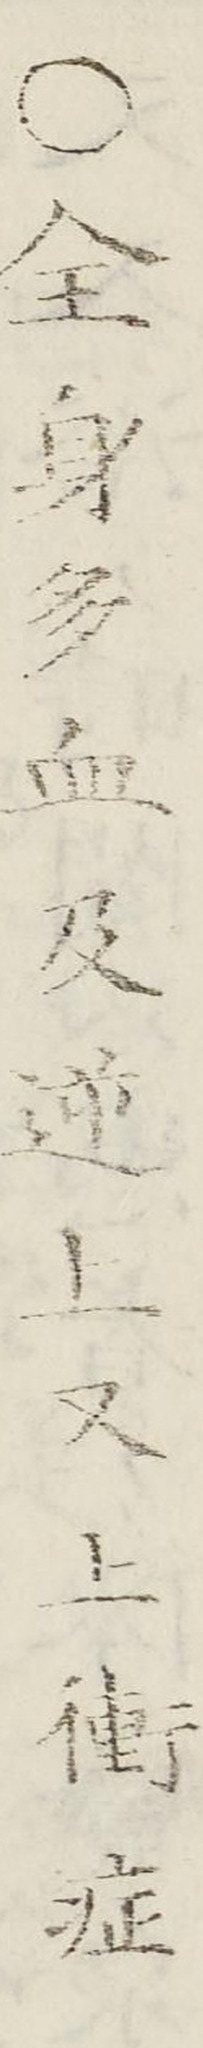〇全身多血及逆上又上衝症
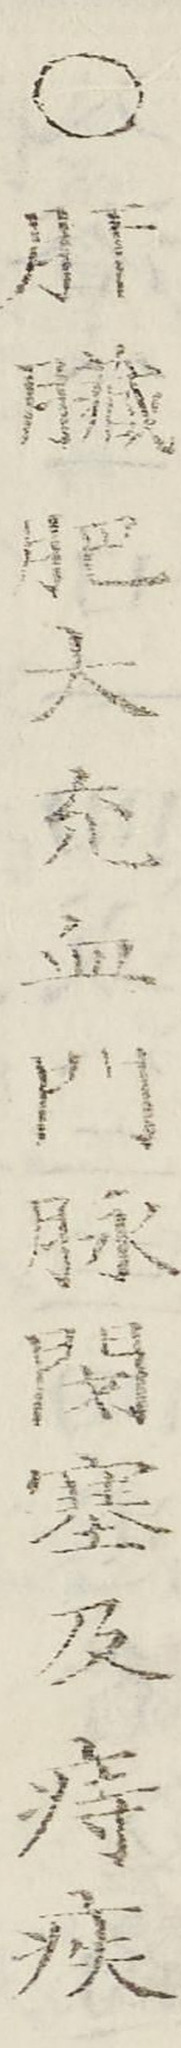〇肝臓肥大充血門脈閉塞及痔疾
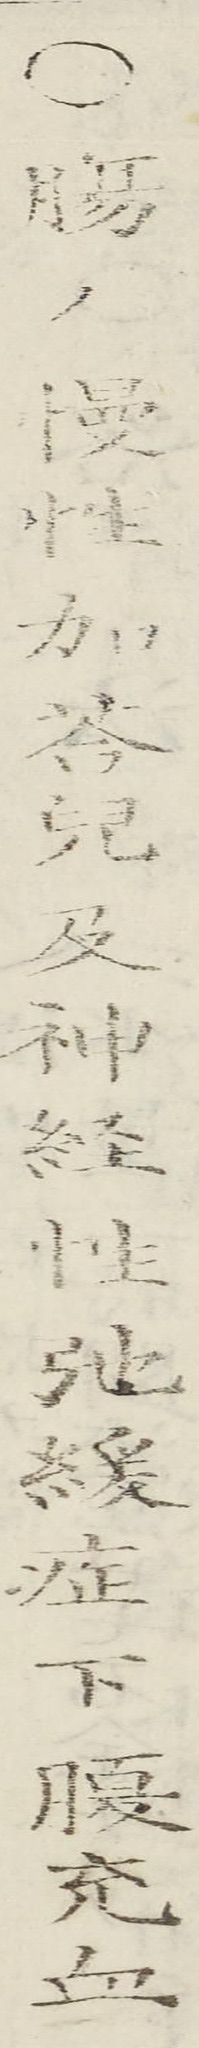〇腸ノ慢性加答児及神経性弛緩症下腹充血
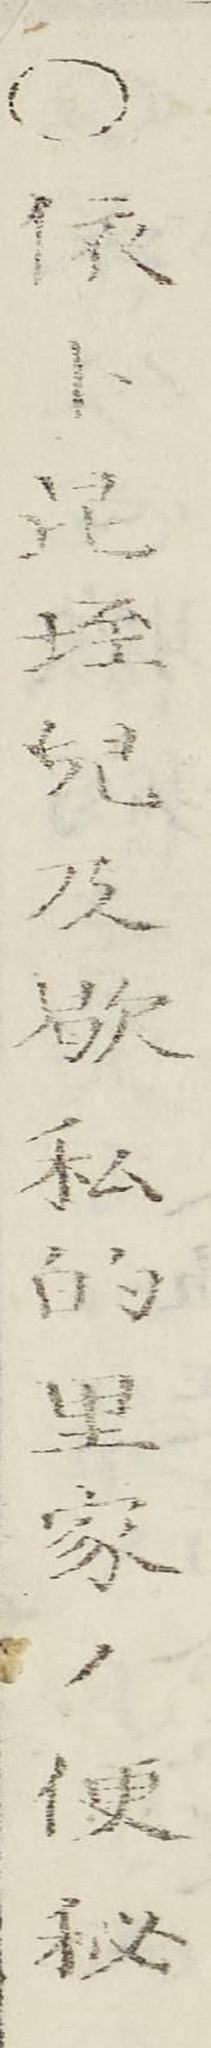〇依卜昆垤児及歇私的里家ノ便秘

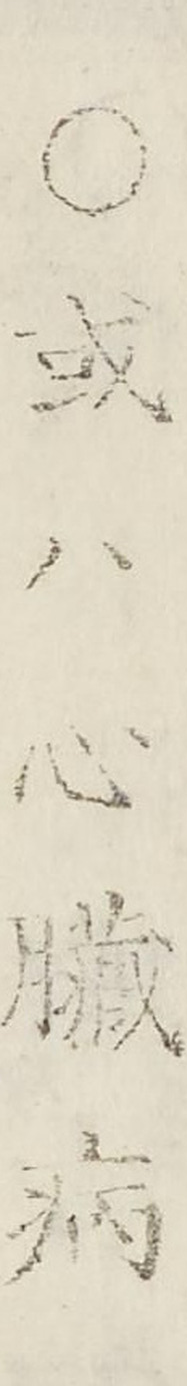〇或ハ心臓病
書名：鎌先温泉由來記
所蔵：東京大学地震研究所図書室 Earthquake Research Institute Library, The University of Tokyo, JAPAN
